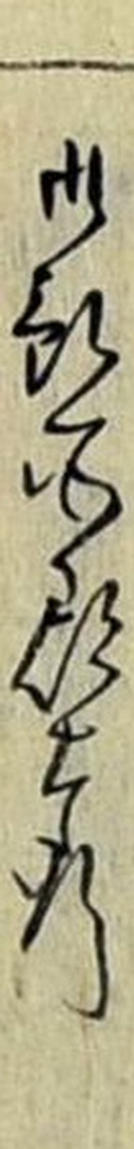御預所郡奉行
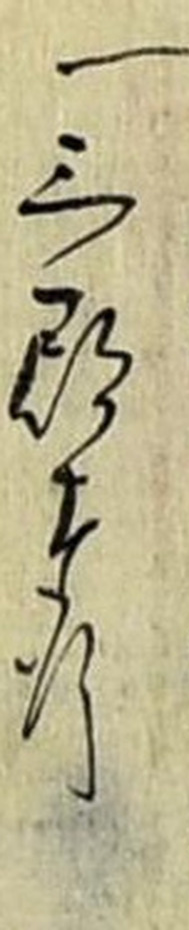三郡奉行
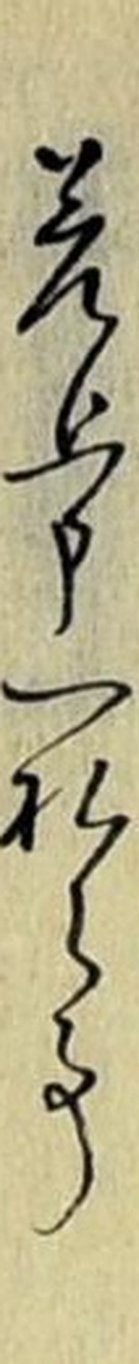差上申一札之事
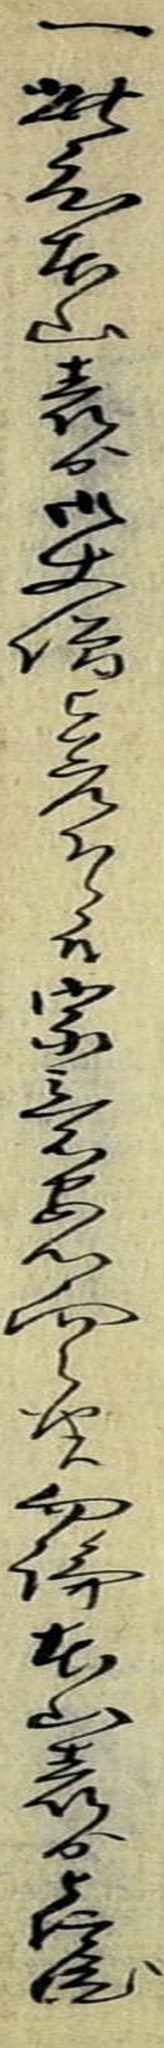一此度本山表ゟ御使僧被差下候に付宗意安心向之儀ハ勿論本山表ゟ被仰渡
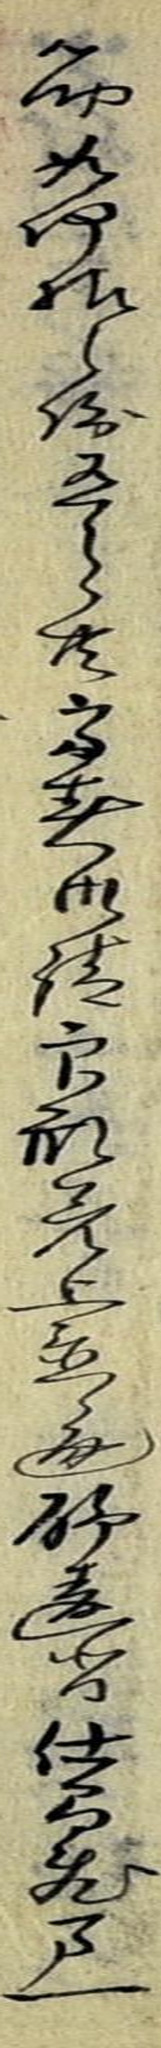筋如何様之儀有之候共当春御請印形差上置候通聊違背仕間敷万一
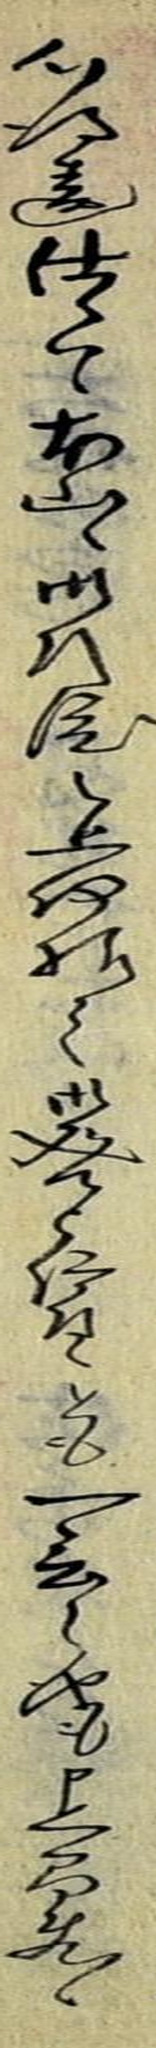心得違仕候はヽ本山へ御引渡之上如何様之御咎被仰付候とも一言之儀も申上間敷候
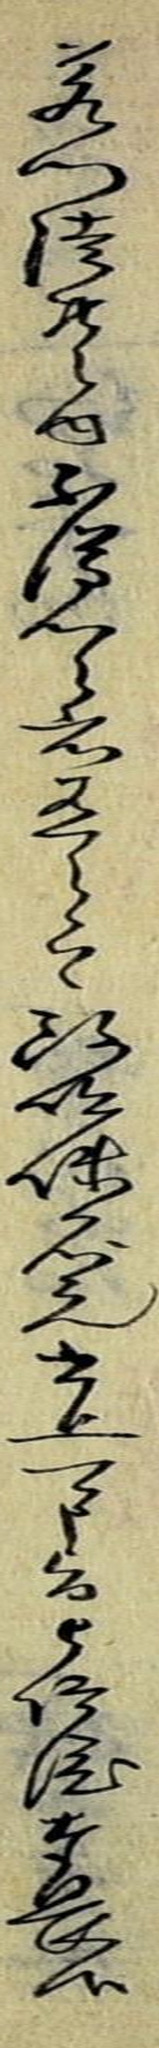若門徒共之内不得心之者有之候はヽ致吟味名元書上可申旨被仰渡奉畏候
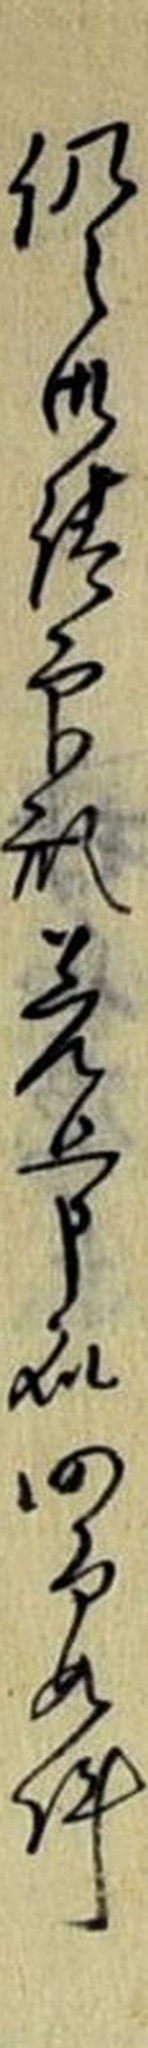仍之御請印形差上申処仍而如件
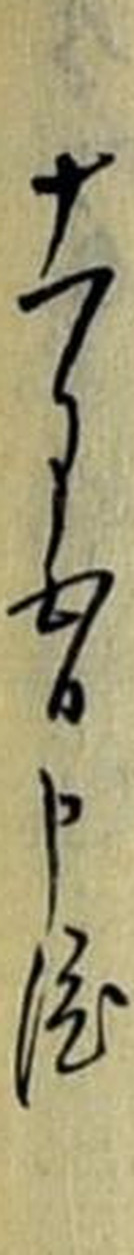十一月五日申渡
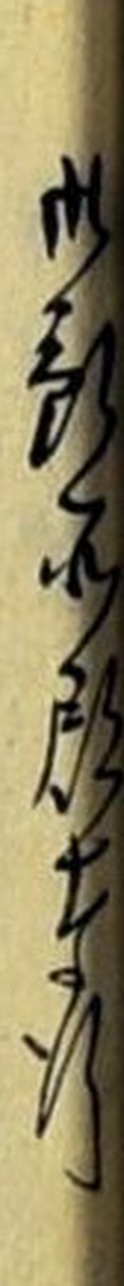御預所郡奉行
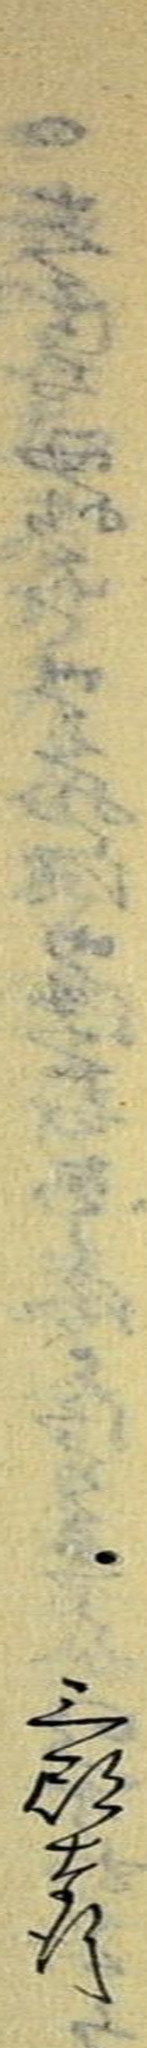三郡奉行
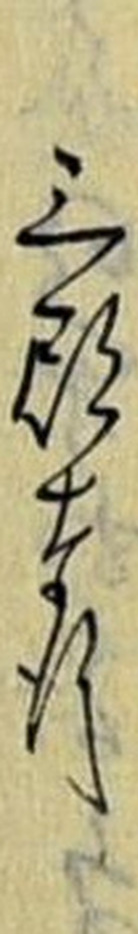三郡奉行
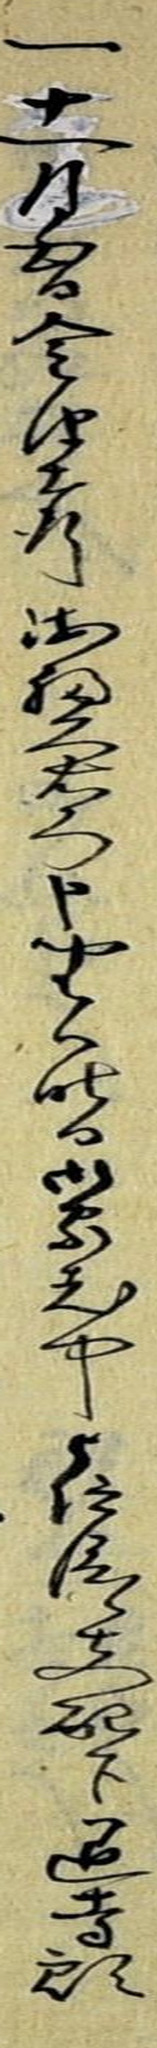一十一月五日金津奉行海福久右衛門申聞候は昨日御家老中被仰渡候支配下通寺願
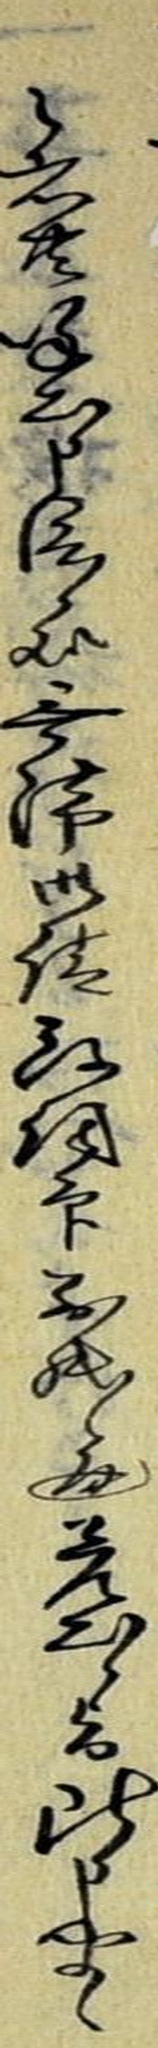之者共呼出申渡候処無滞御請致調印別紙之通差出候旨断申聞候
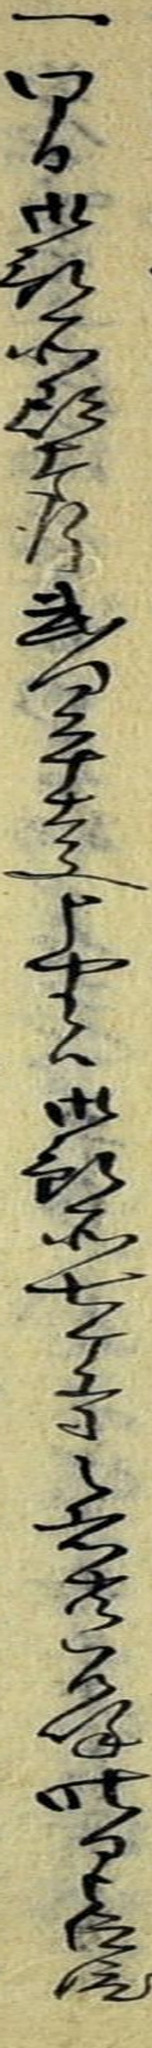一同日御預所郡奉行武田平太夫申聞候は御預所七ヶ寺之者共召呼昨日被仰渡
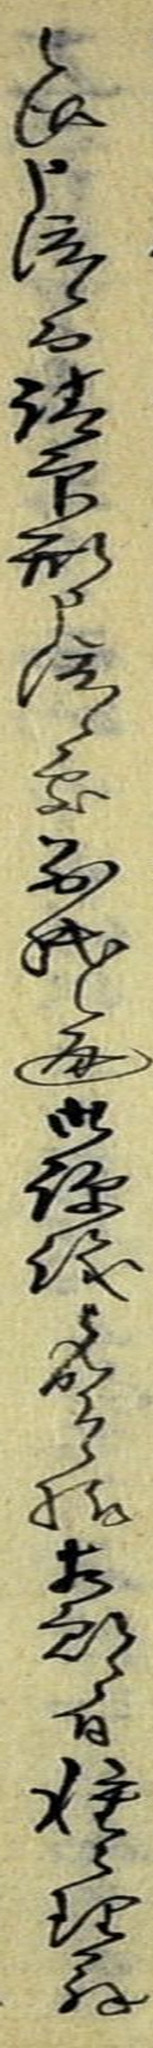候趣申談候而請印形申渡候処別紙之通御評議被成下候様相願候に付種々理解
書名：命令之部 四
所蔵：福井県文書館 Fukui Prefectural Archives
